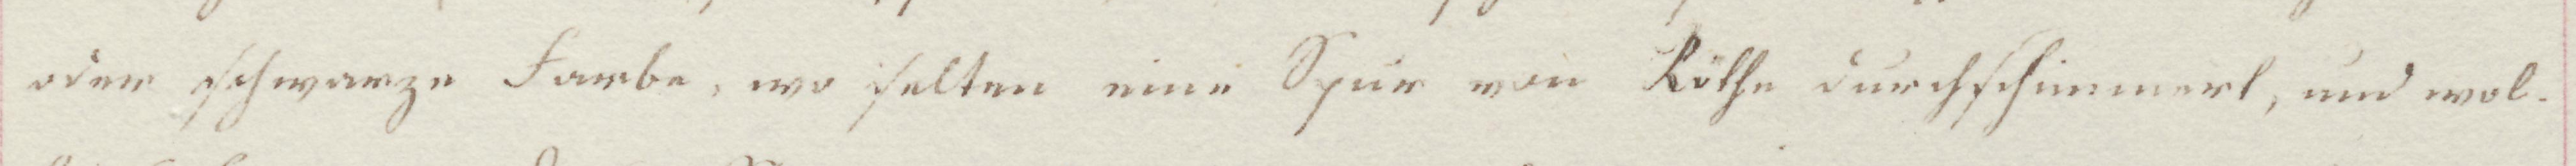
oder schwarze Farbe, wo selten eine Spur von Röthe durchschimmert, und wol-
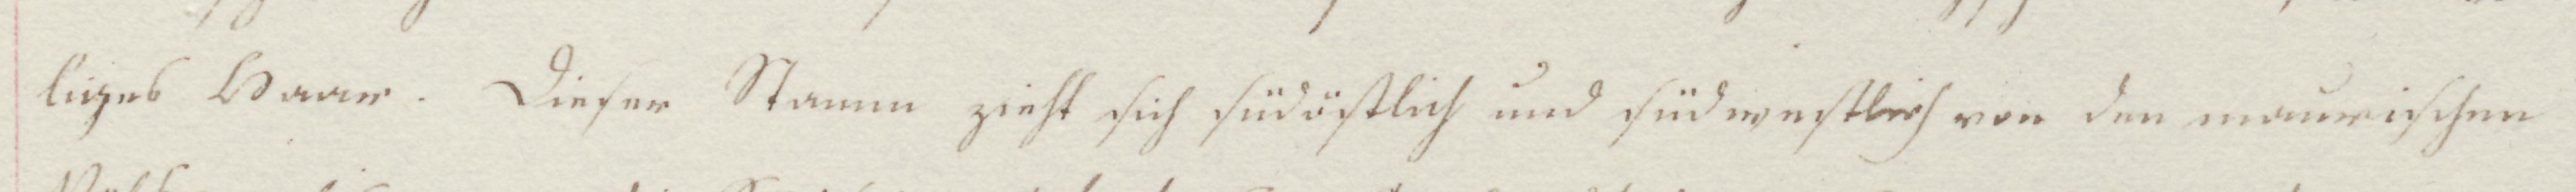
liges Haar. Dieser Stamm zieht sich südöstlich und südwestlich von den maurischen
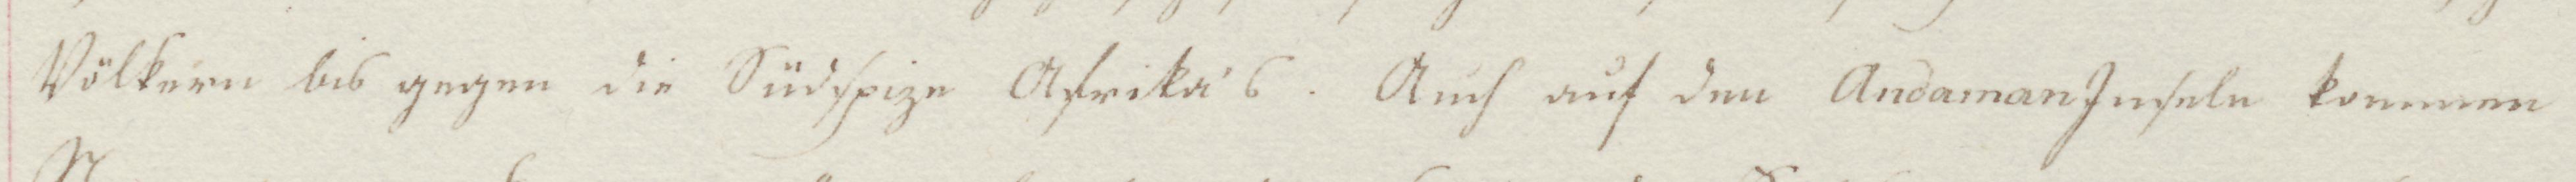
Völkern bis gegen die Südspize Afrika's. Auch auf den AndamanInseln kommen
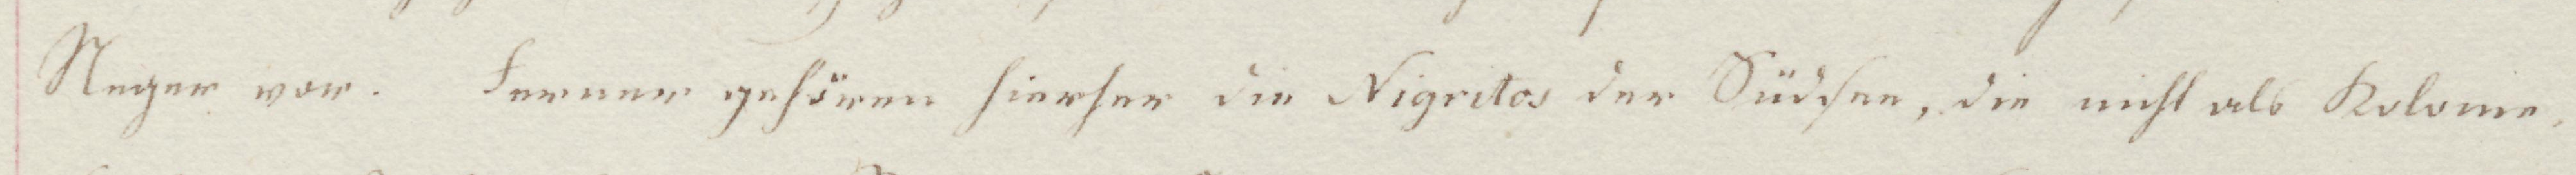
Neger vor. Ferner gehören hierher die Nigritos der Südsee, die nicht als Kolonie,
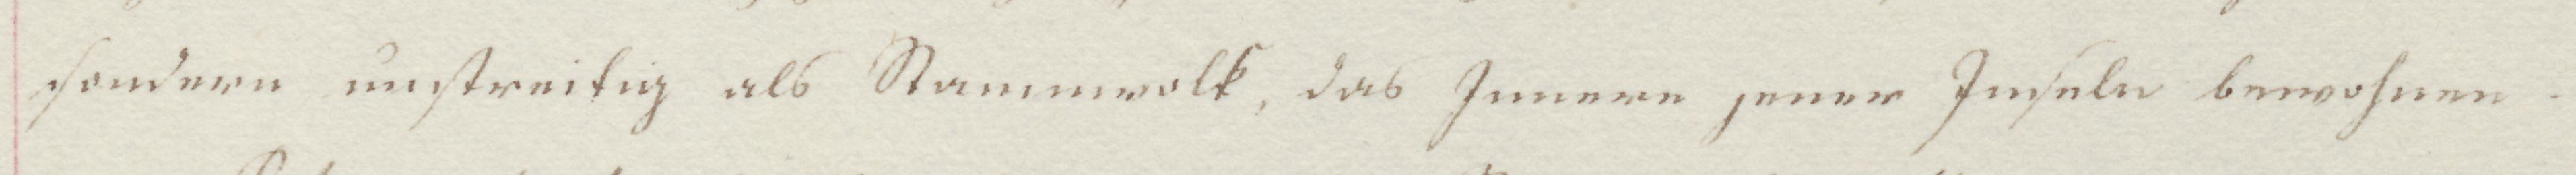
sondern unstreitig als Stammvolk, das Innere jener Inseln bewohnen.
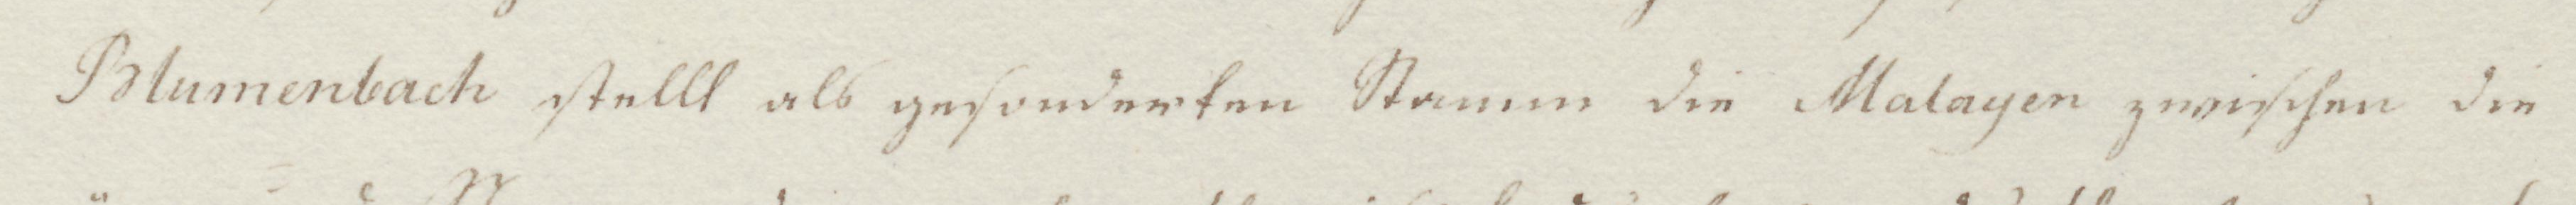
Blumenbach stellt als gesonderten Stamm die Malayen zwischen die
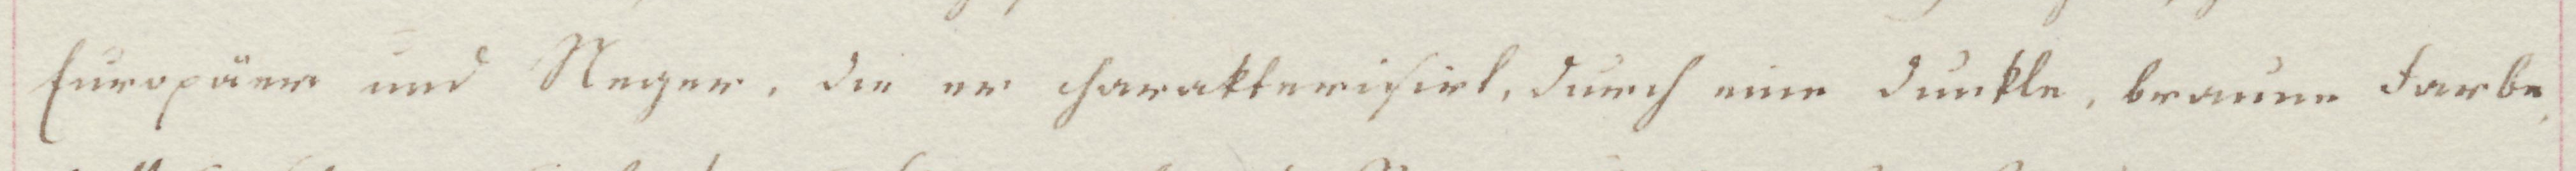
Europäer und Neger, die er charakterisirt, durch eine dunkle, braune Farbe,
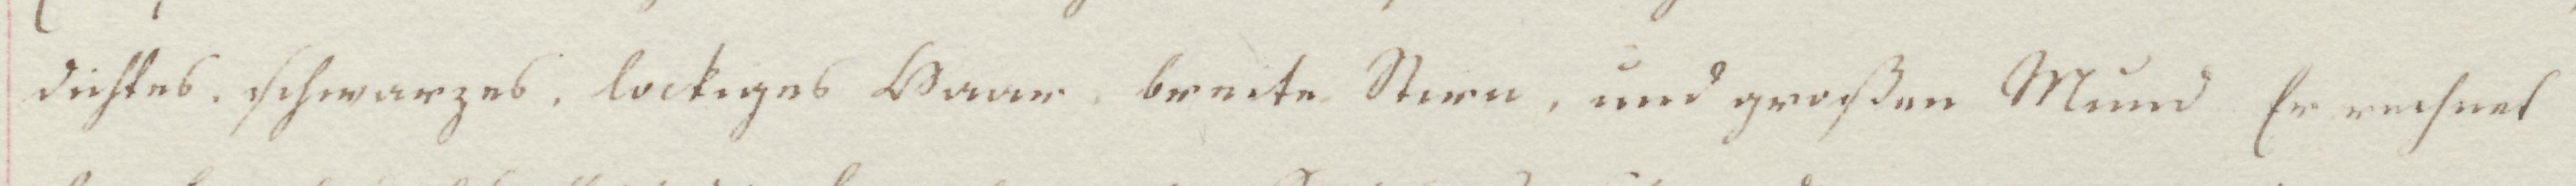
dichtes, schwarzes, lockiges Haar, breite Stirn, und großen Mund. Er rechnet
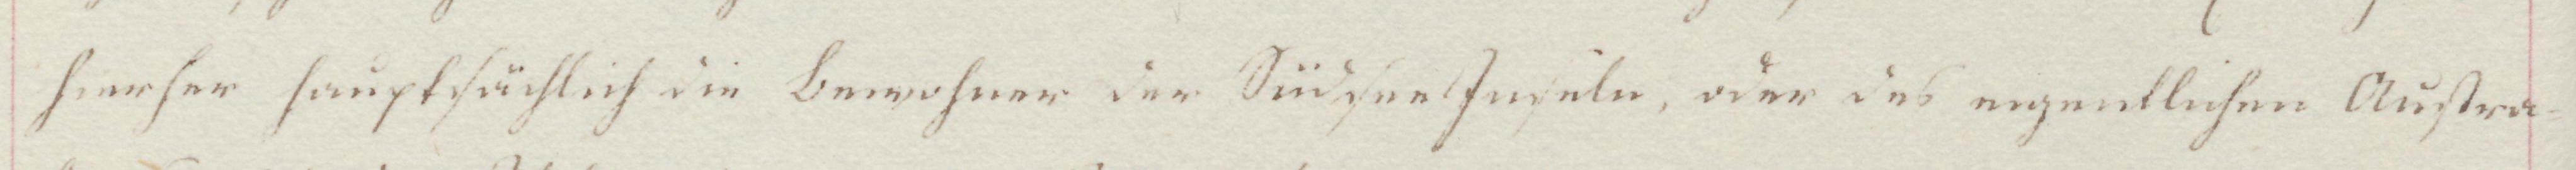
hierher hauptsächlich die Bewohner der SüdseeInseln, oder des eigentlichen Austra-
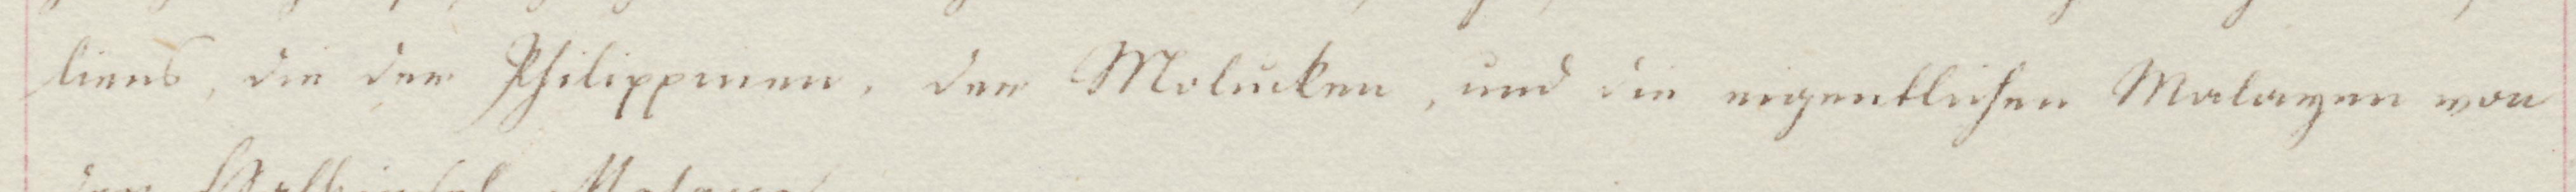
liens, die der Philippinen, der Molucken, und die eigentlichen Malayen von
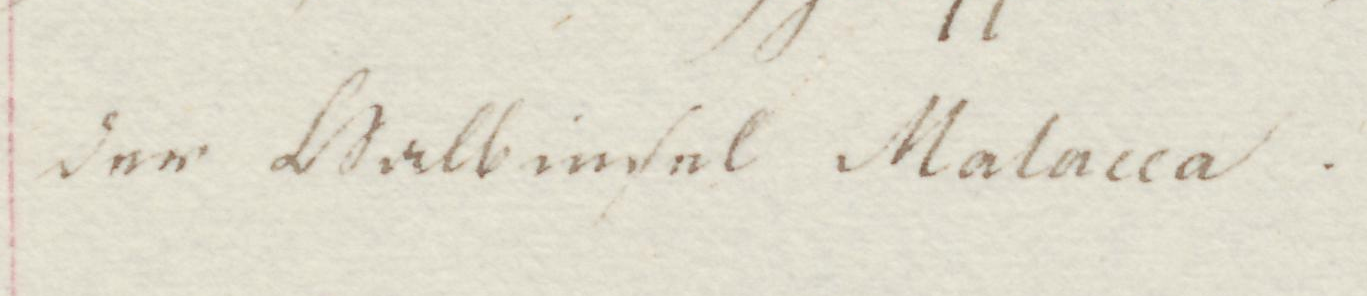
der Halbinsel Malacca.
